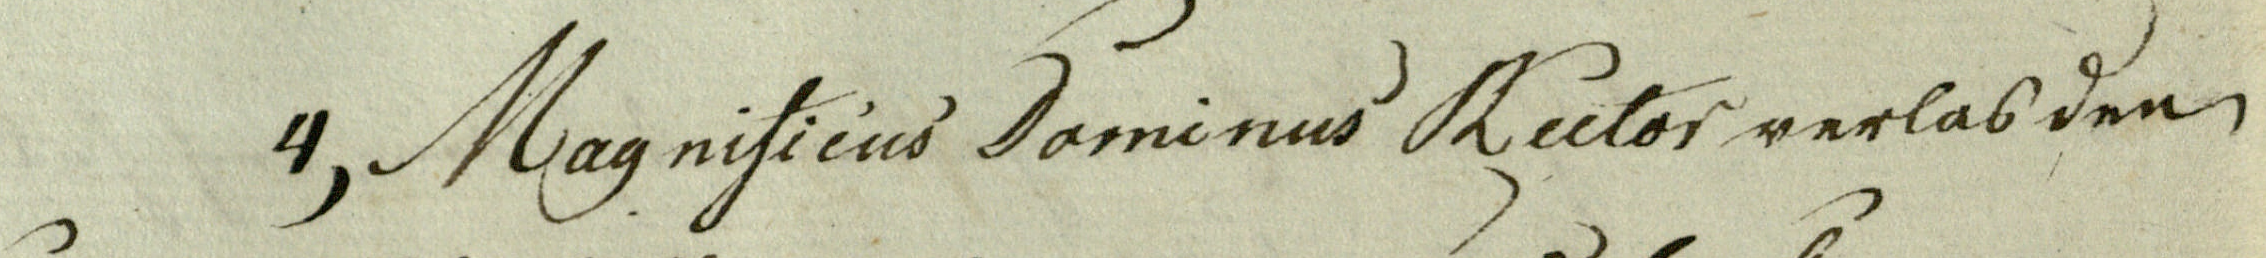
4, Magnificus Dominus Rector verlas den,
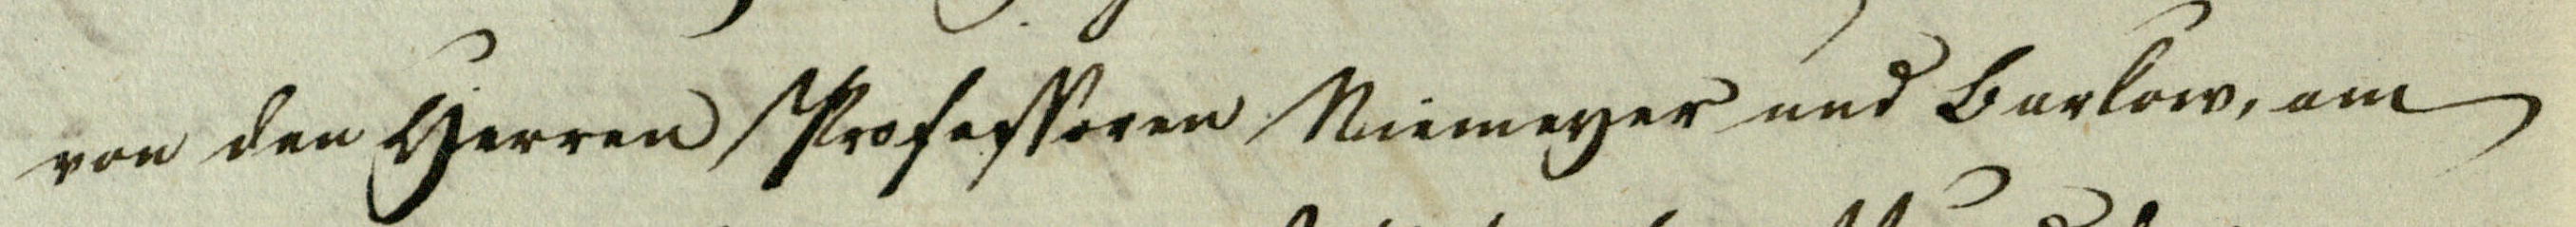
von den Herren Professoren Niemeyer und Barkow, am
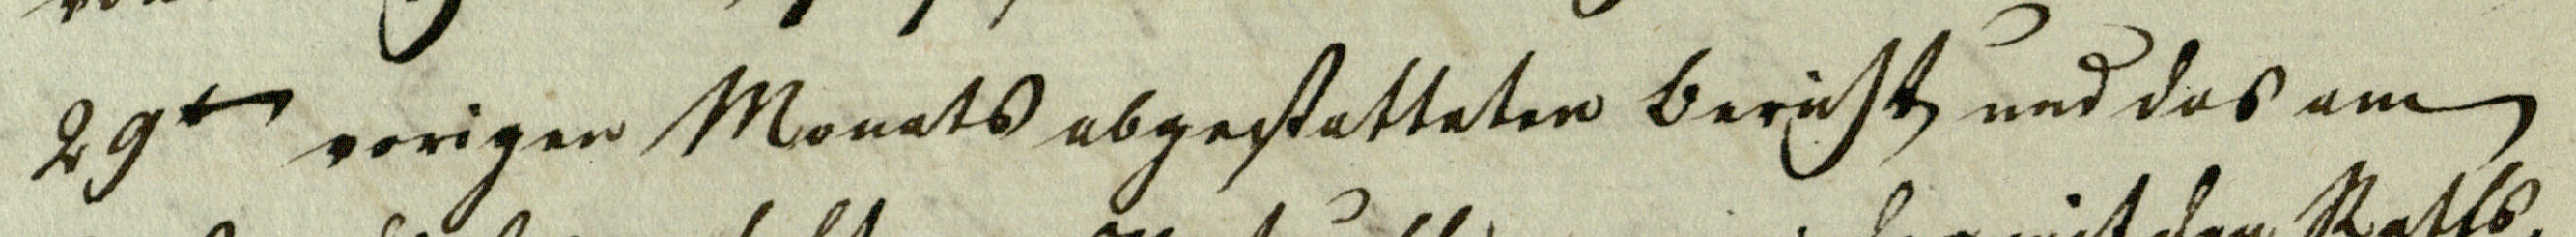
29sten vorigen Monats abgestatteten Bericht, und das am
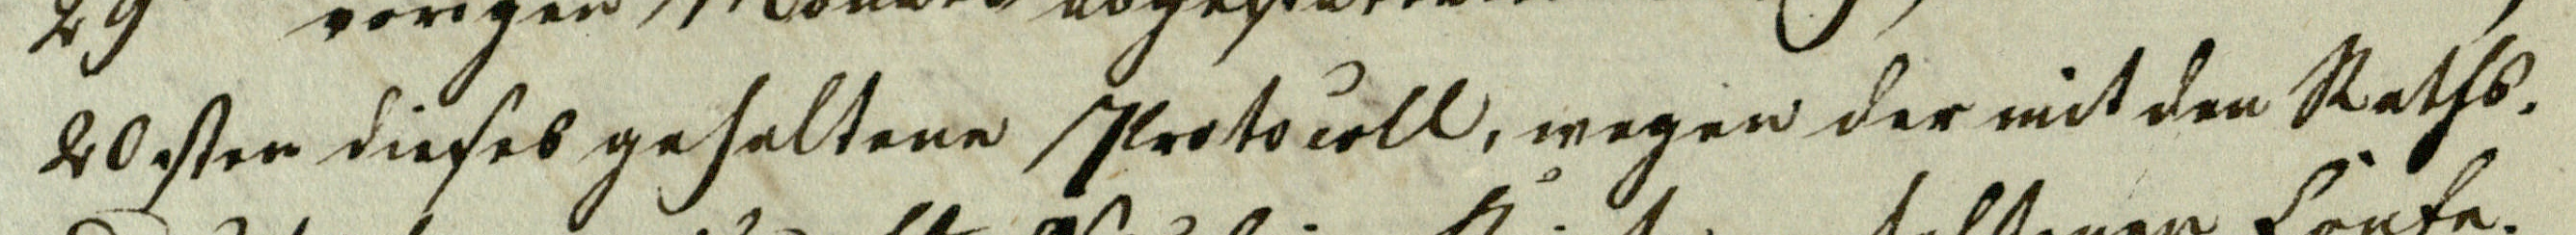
20sten dieses gehaltene Protocoll, wegen der mit den Raths¬
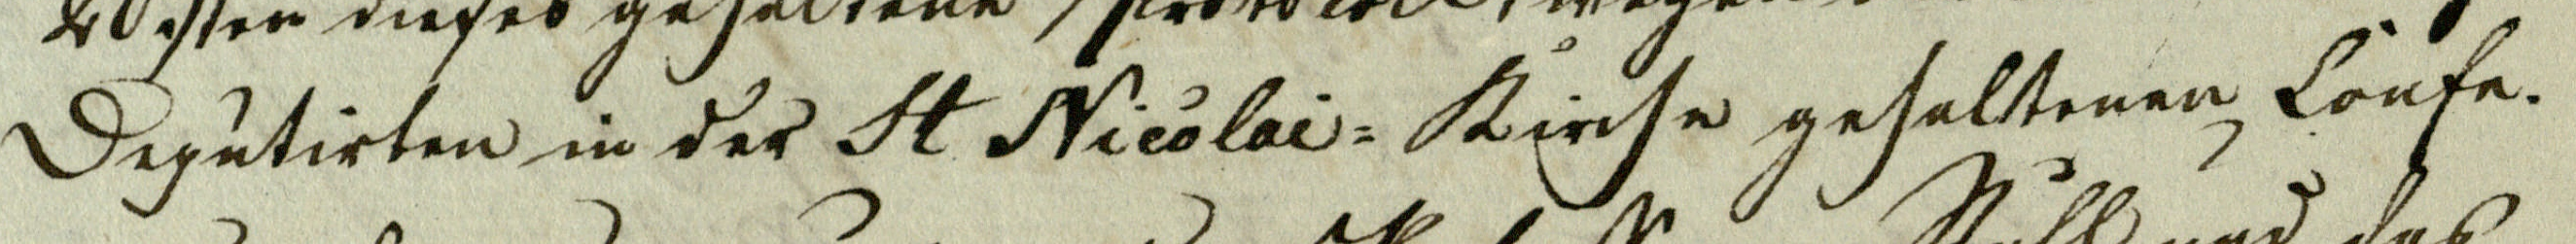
Deputirten in der St Nicolai-Kirche gehaltenen Confe¬
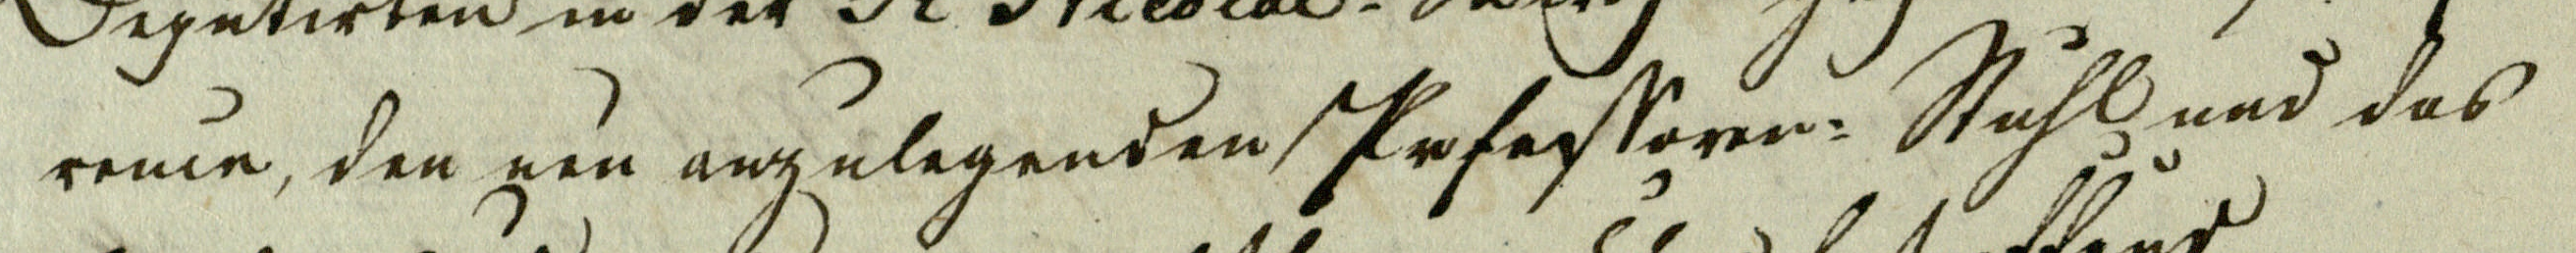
rence, den neu anzulegenden Professoren-Stuhl und das
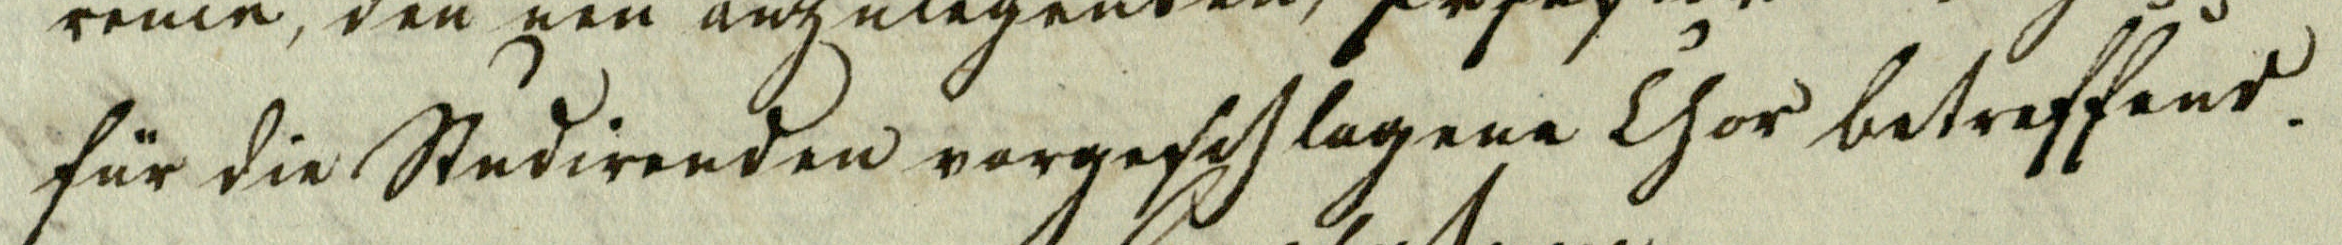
für die Studirenden vorgeschlagene Chor betreffend.
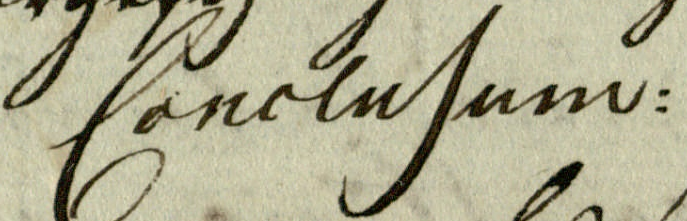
Conclusum:
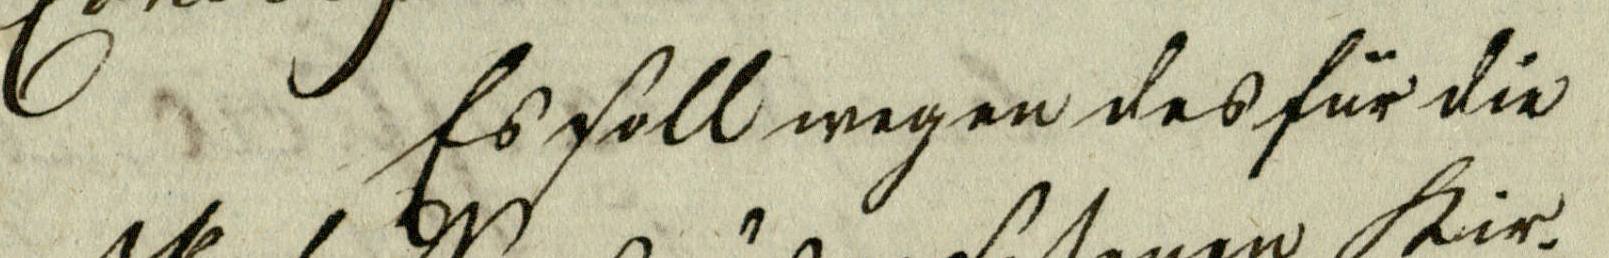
Es soll wegen des für die
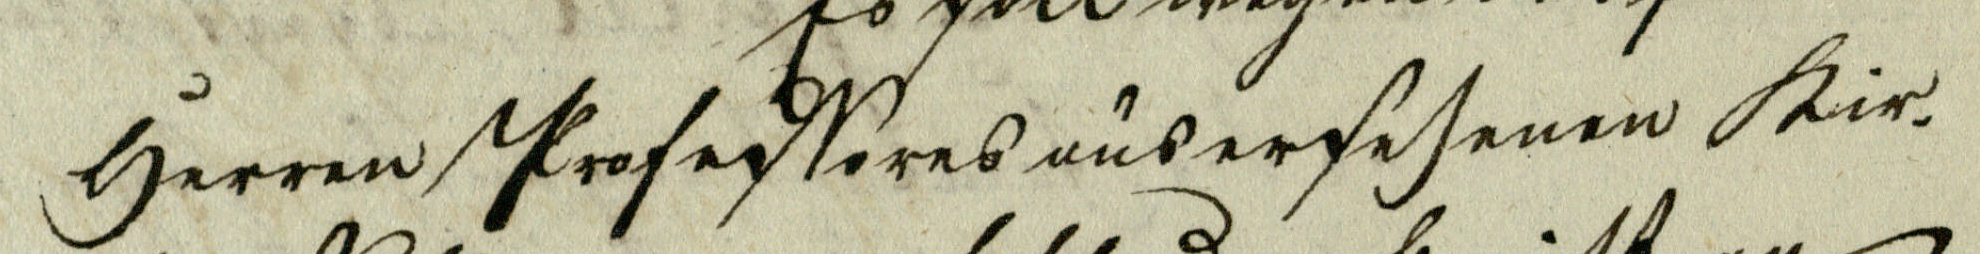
Herren Professores ausersehenen Kir¬
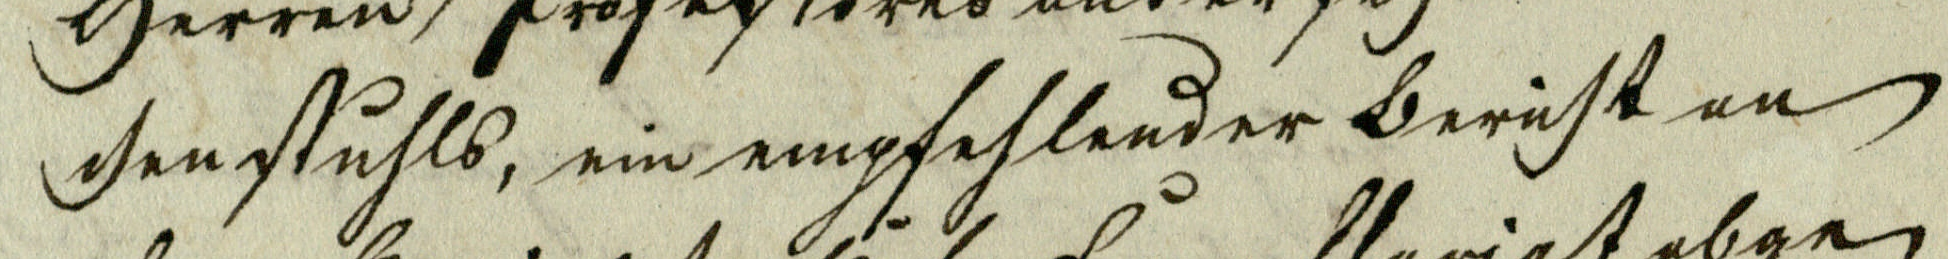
chenstuhls, ein empfehlender Bericht an
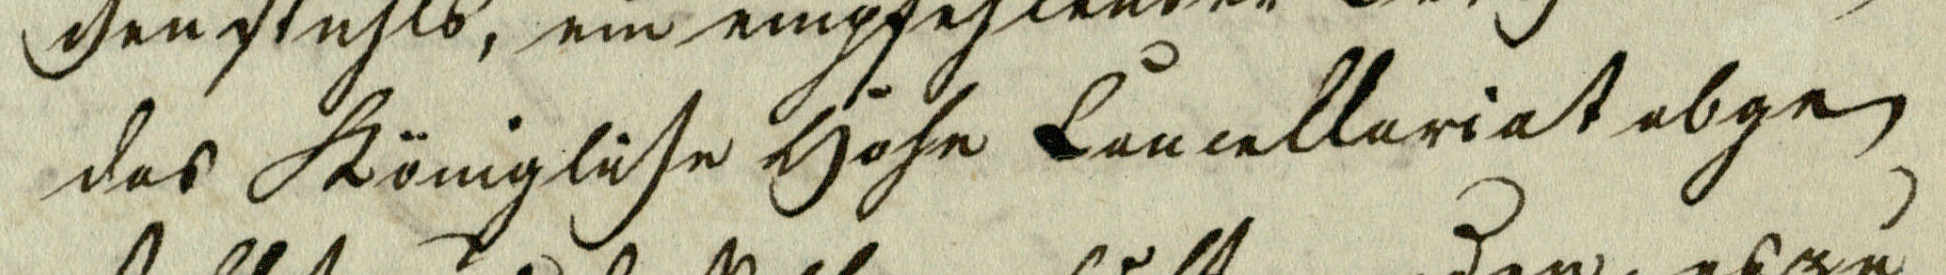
das Königliche Hohe Cancellariat abge¬
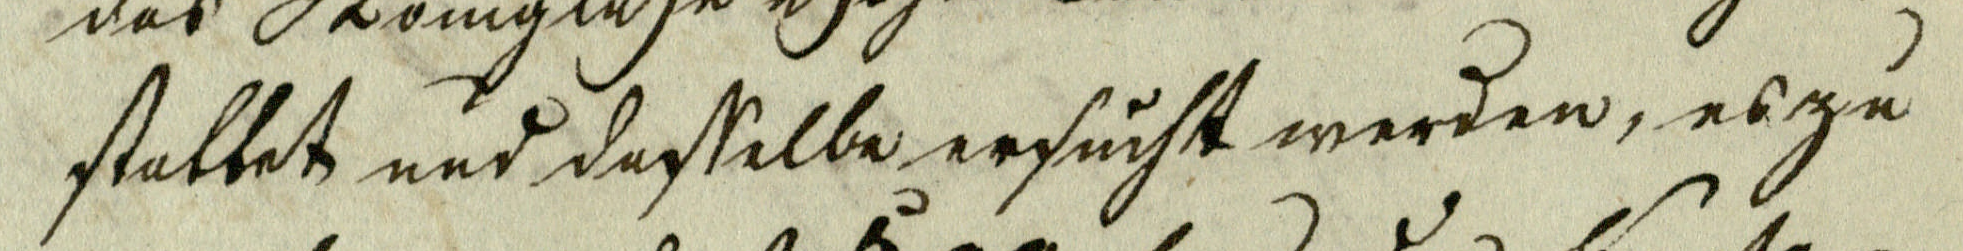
stattet und dasselbe ersucht werden, es zu
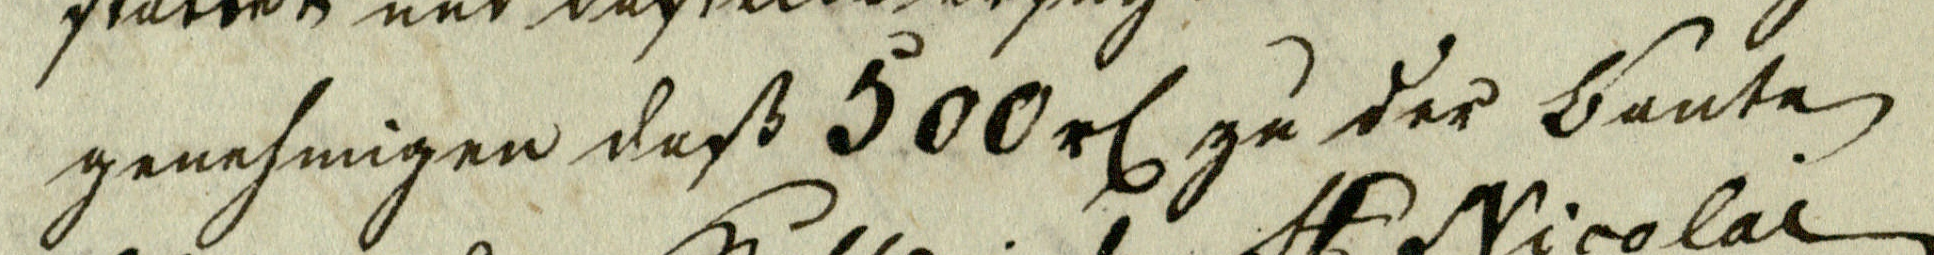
genehmigen daß 500 r zu der Baute
